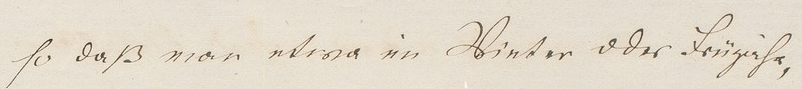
so daß man etwa im Winter oder Früjahr,
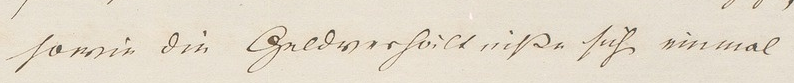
sowie die Geldverhältniße sich einmal
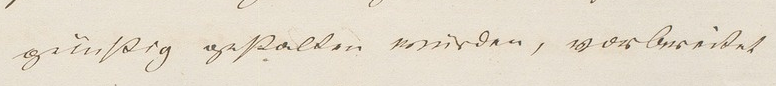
günstig gestalten würden, vorbereitet
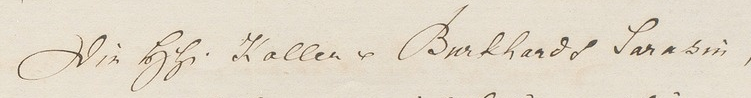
Die HH. Koller & Burkhardt Sarasin,
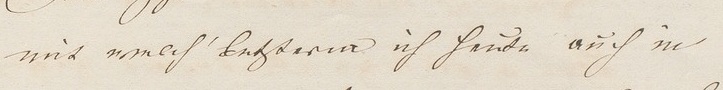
mit welch' letzterm ich heute auch in
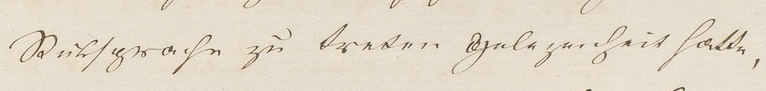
Rüksprache zu treten Gelegenheit hatte,
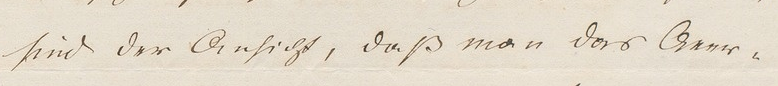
sind der Ansicht, daß man das Aner-
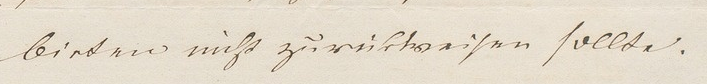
bieten nicht zurükweisen sollte.
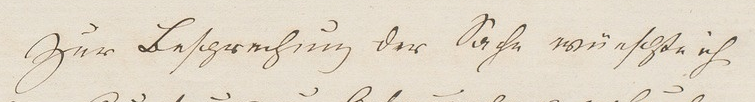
Zur Besprechung der Sache wünschte ich
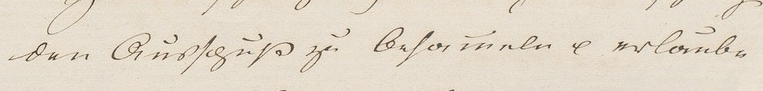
den Ausschuß zu besammeln & erlaube
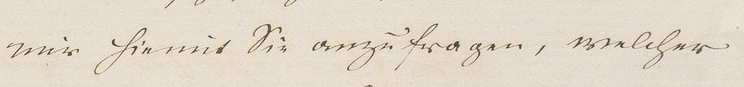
mir hiemit Sie anzufragen, welcher
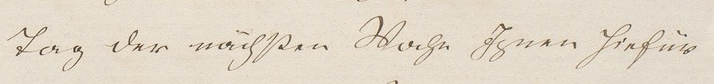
Tag der nächsten Woche Ihnen hiefür
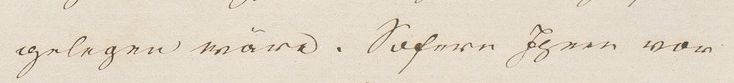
gelegen wäre. Sofern Ihnen vor
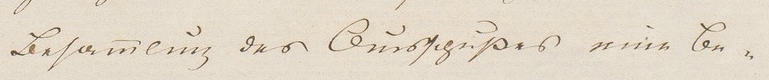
Besammlung des Ausschußes eine Be-
